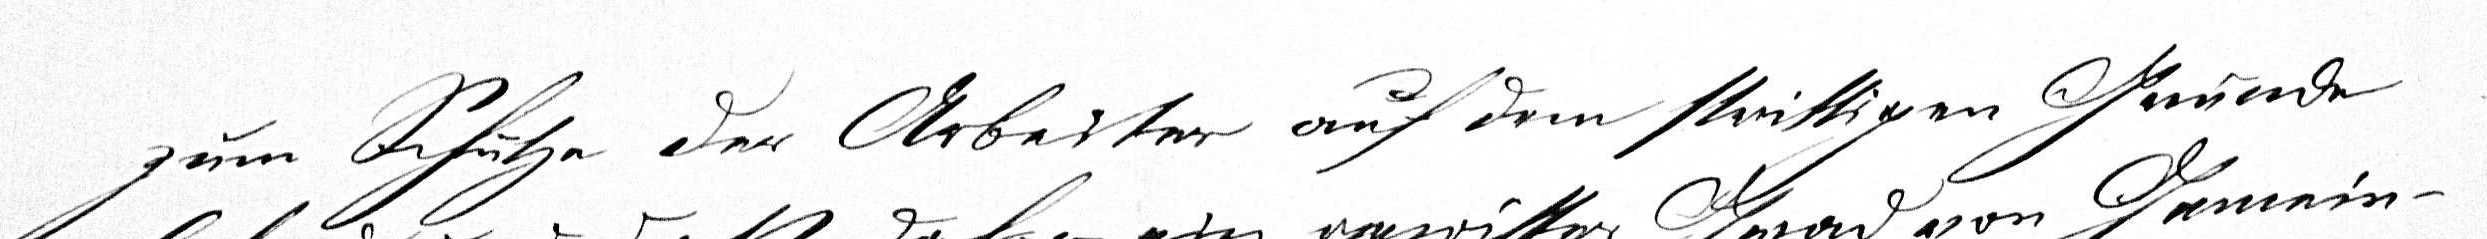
zum Schutze der Arbeiter auf dem strittigen Grunde
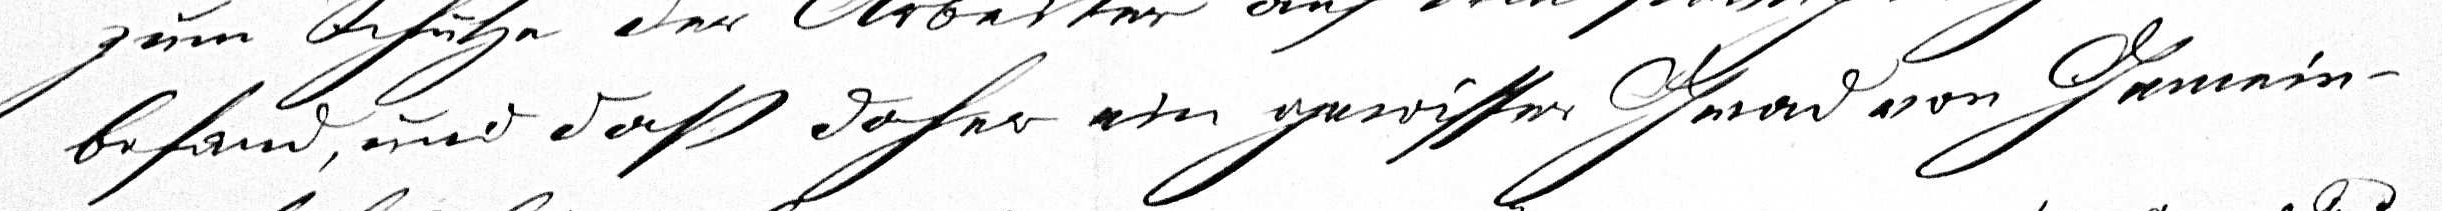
befand, und daß daher ein gewisser Grad von Gemein¬
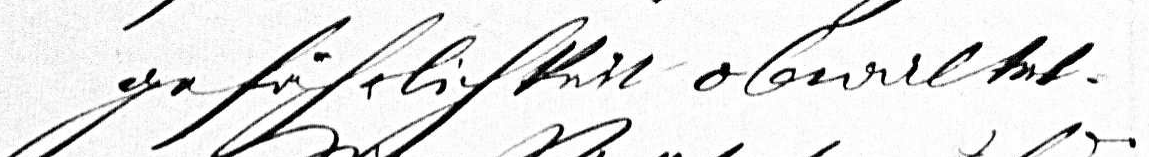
gefährlichkeit obwaltet.
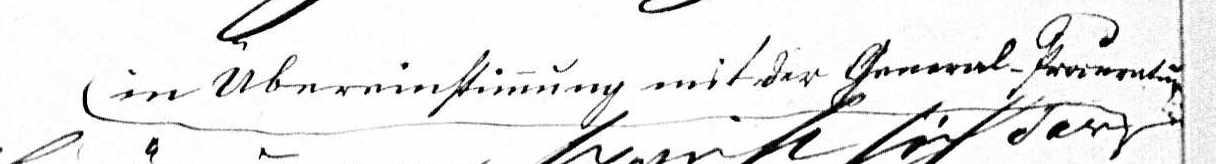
in Übereinstimmung mit der General-Procuratur
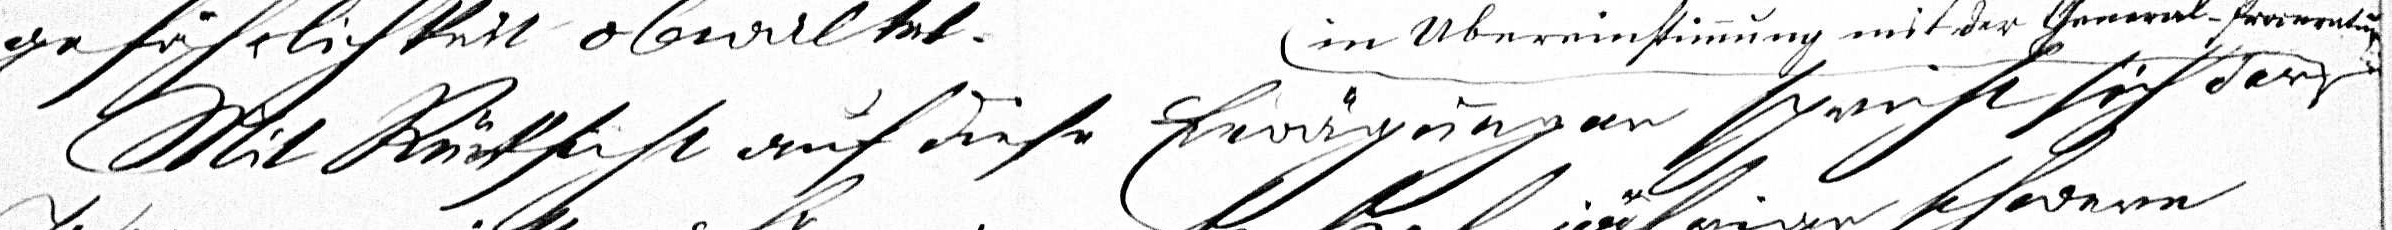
Mit Rücksicht auf diese Erwägungen spricht sich der
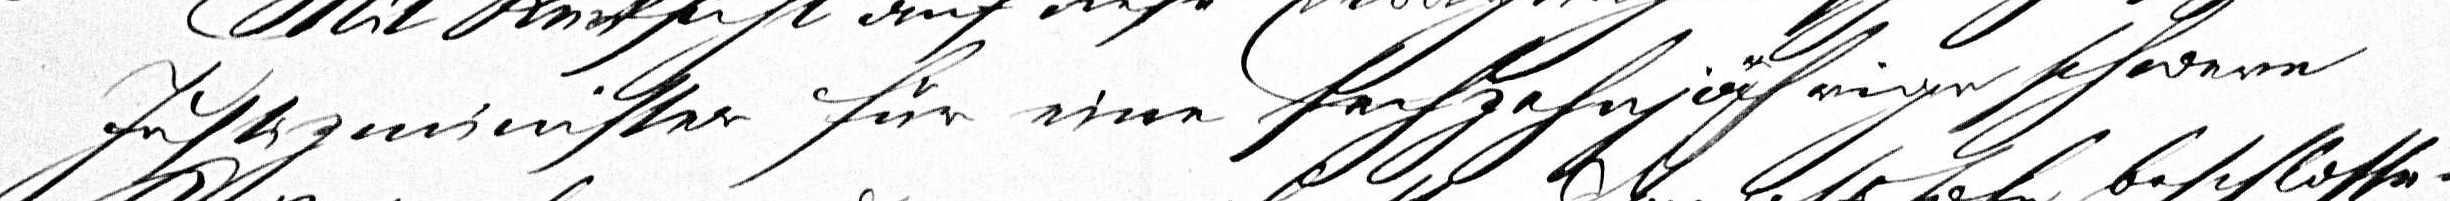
Justizminister für eine sechzehnjährige schwere
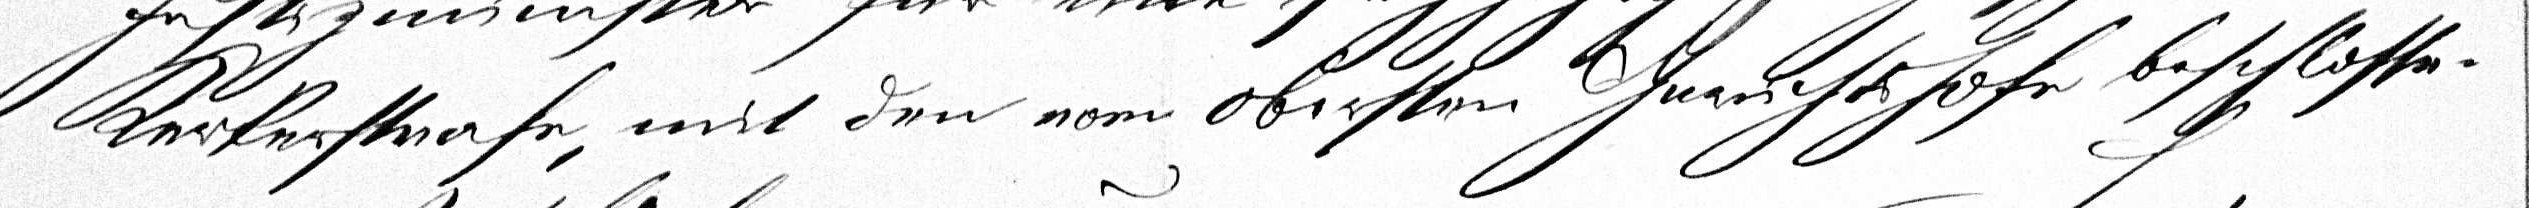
Kerkerstrafe, mit den vom obersten Gerichtshofe beschlosse¬
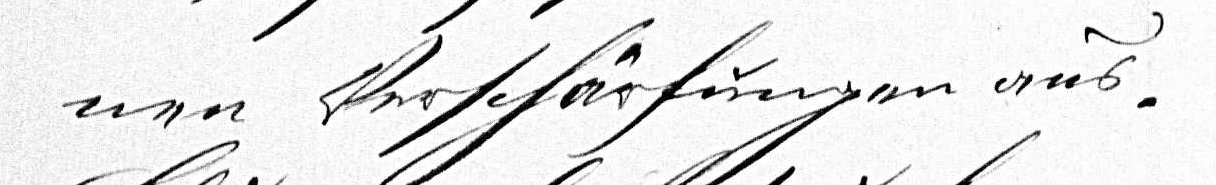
nen Verschärfungen aus.
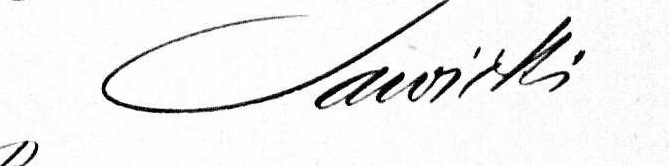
Sawicki
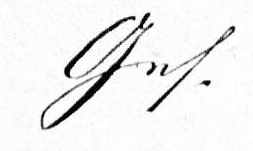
Ges.
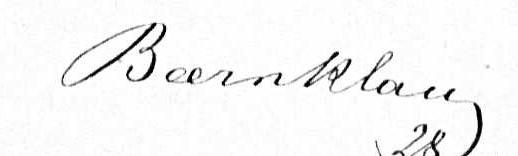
Boernklau
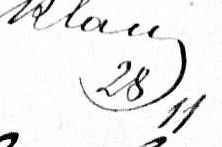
28
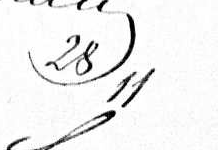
11
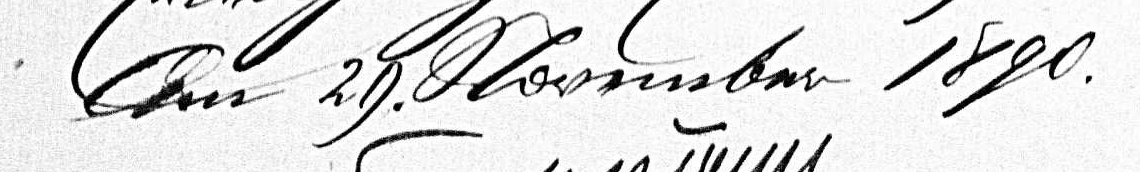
Am 29. November 1890.
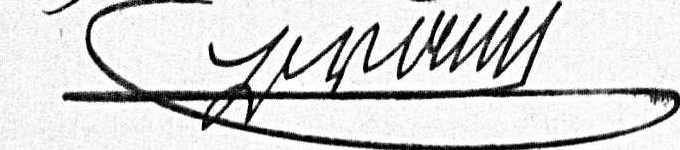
Braun
